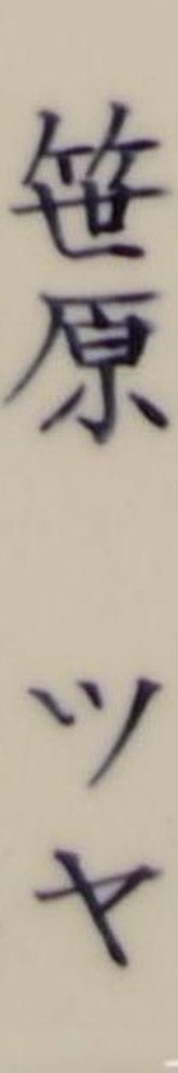笹原ツヤ
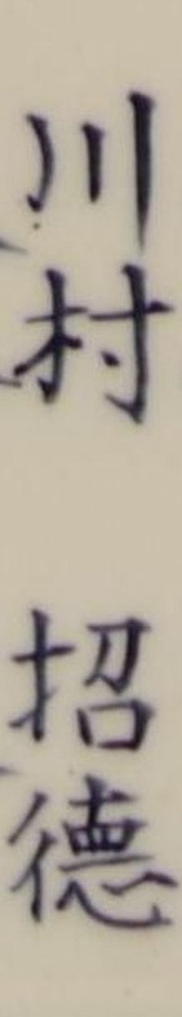川村招徳
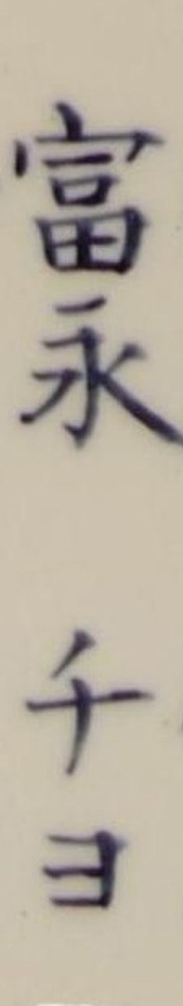富永チヨ
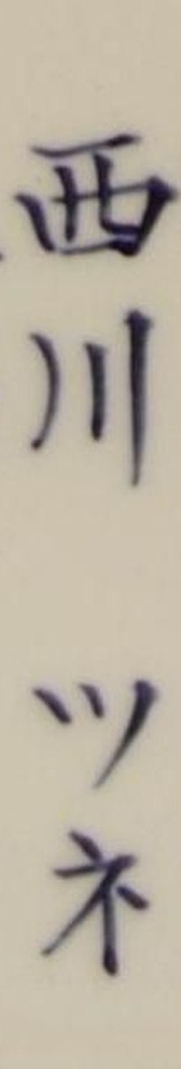西川ツネ
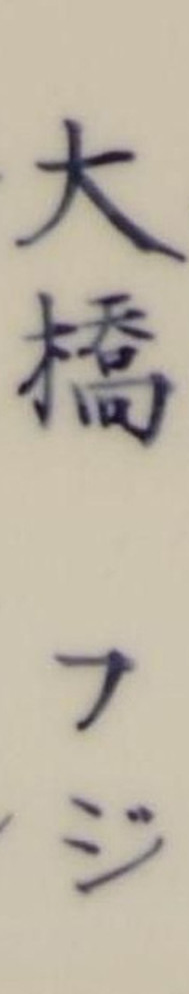大橋フジ
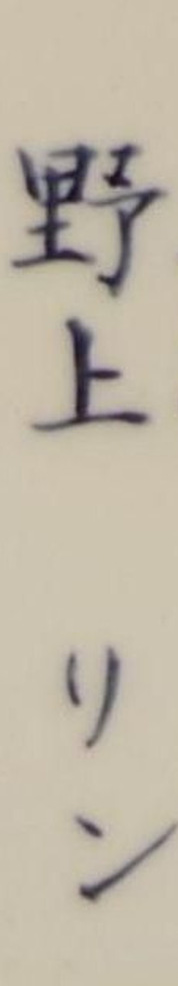野上リン
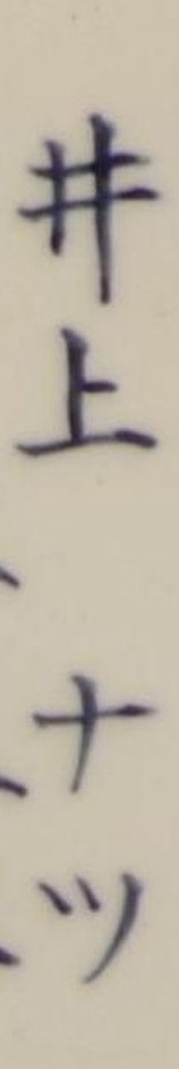井上ナツ
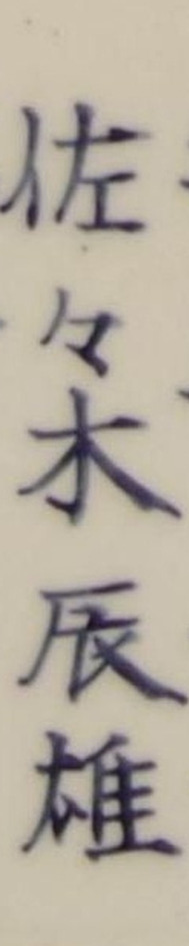佐々木辰雄
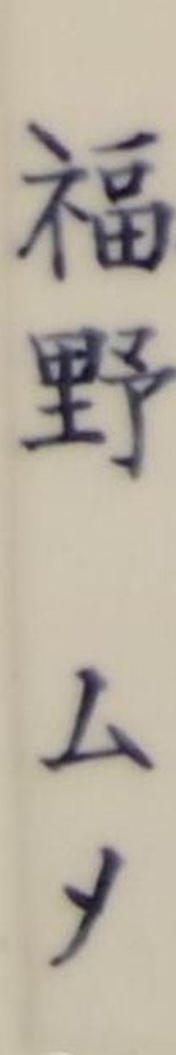福野ムメ

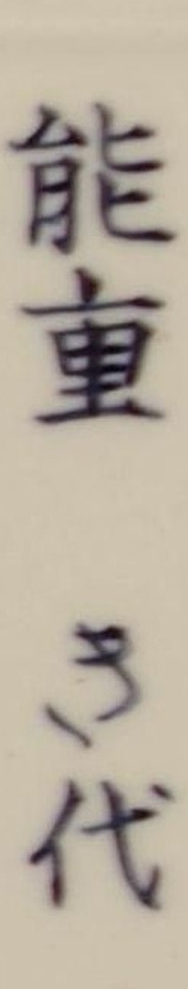能重き代
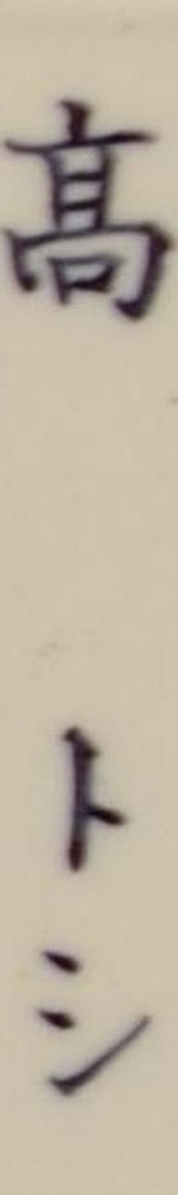高トシ
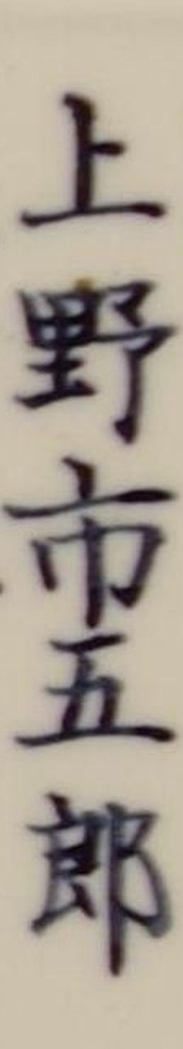上野市五野
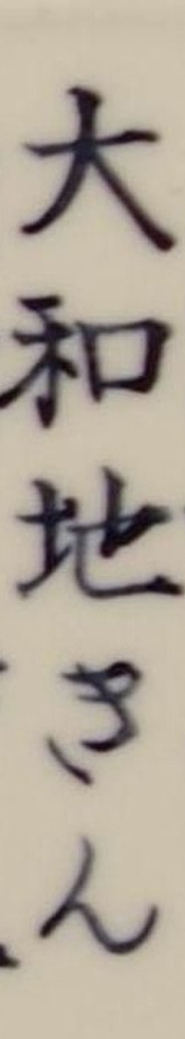大和地きん
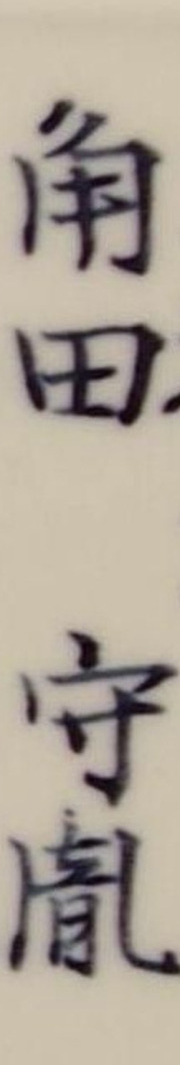角田守胤
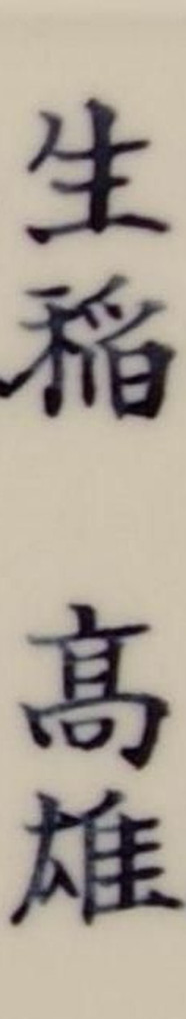生稲高雄
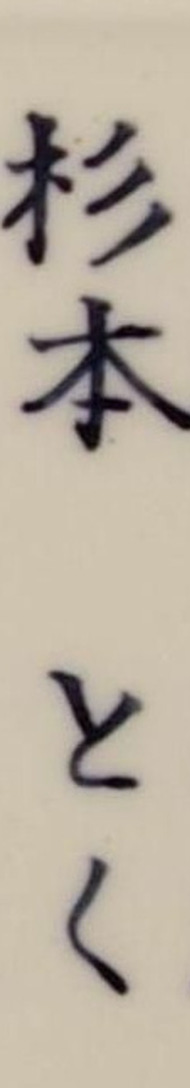杉本とく
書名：E~L
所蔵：高野山金剛峯寺
